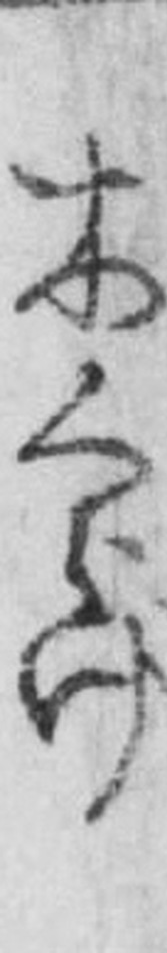木くらげ
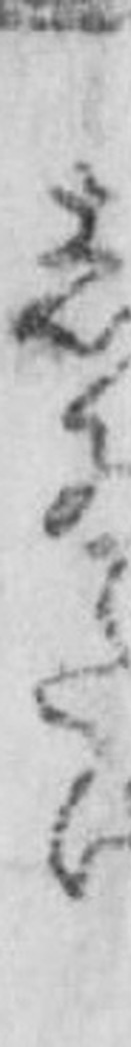しゐたけ
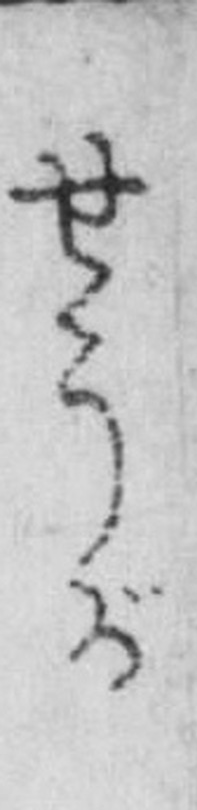せうが
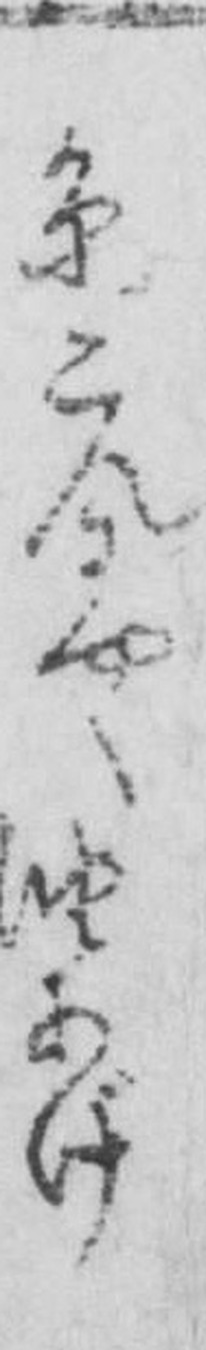糸こんにやく油あげ
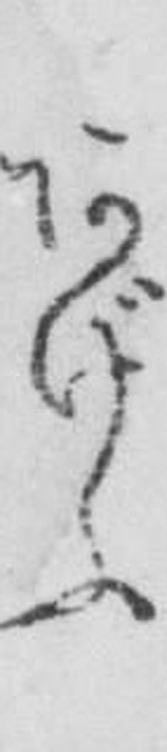あげふ
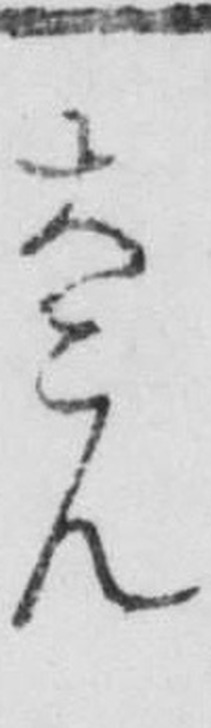大こん
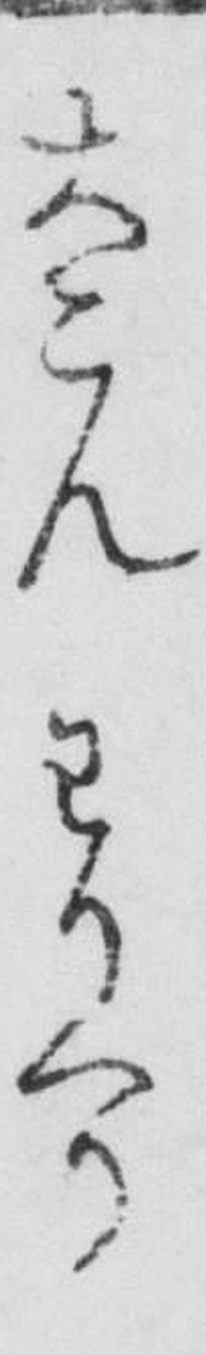大こんわりくり
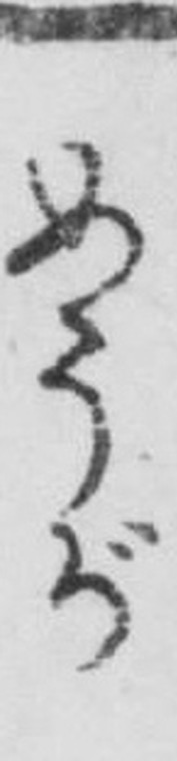せうが
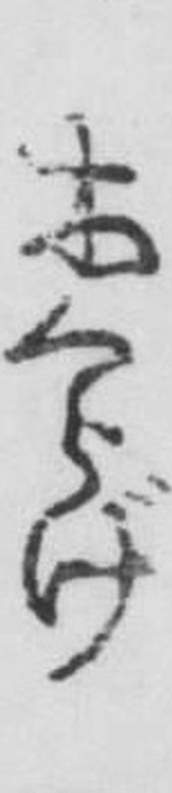木くらげ
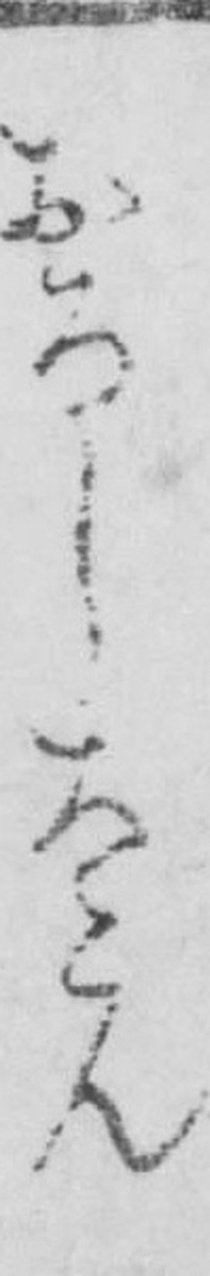おろし大こん
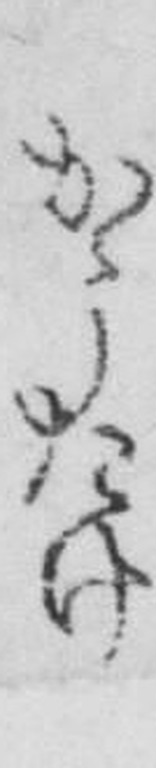かうたけ
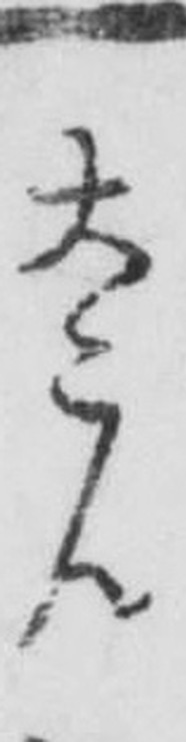大こん
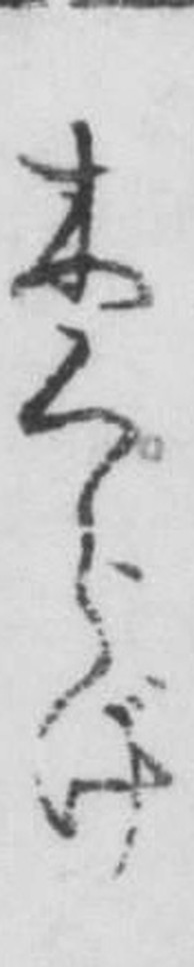木くらげ
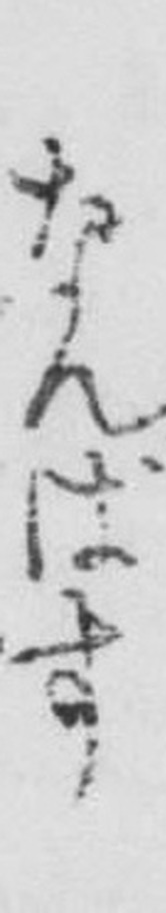なんばず
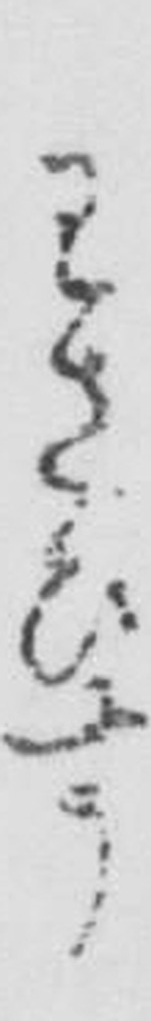わさびす
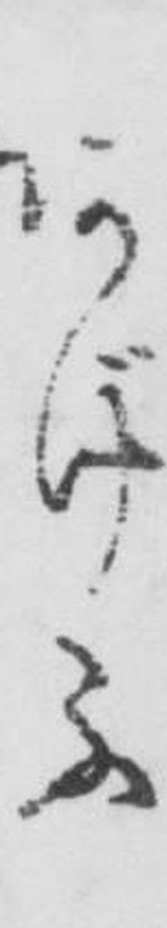あげふ
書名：諸家通用/即席料理
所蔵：大阪府立大学学術情報センター 国文学研究資料館
